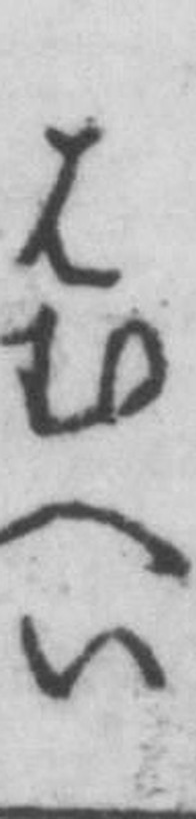はむへい
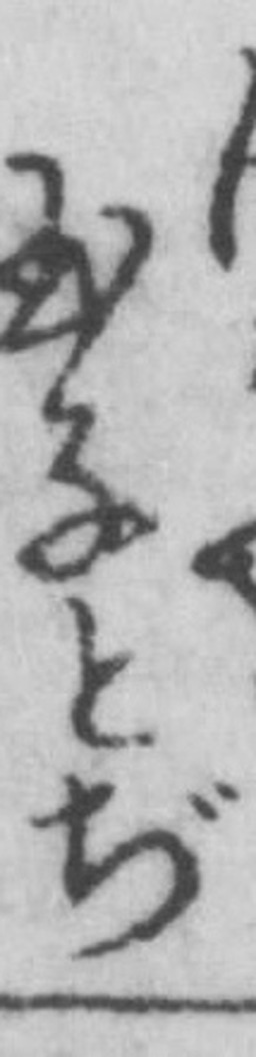玉子とぢ
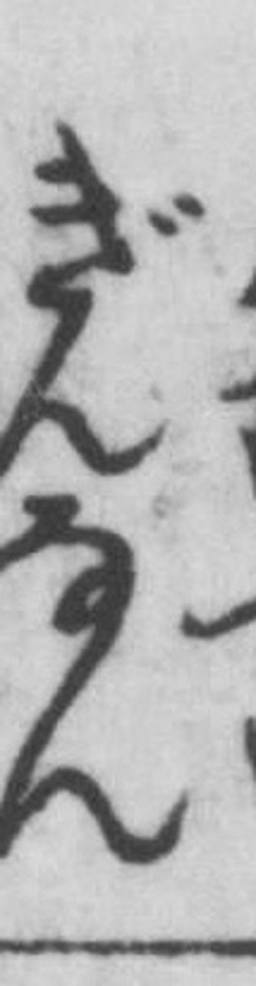ぎんなん
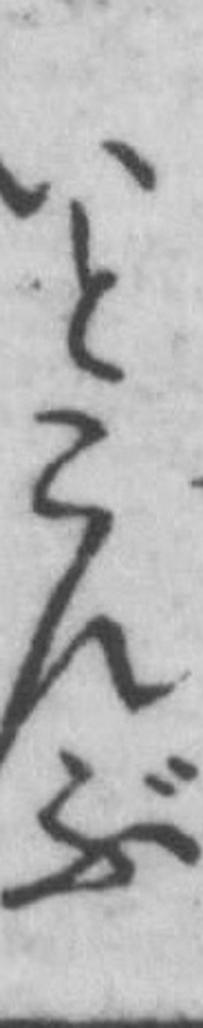いとこんぶ
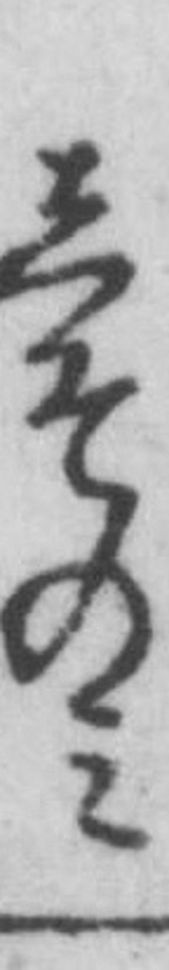しそのみ
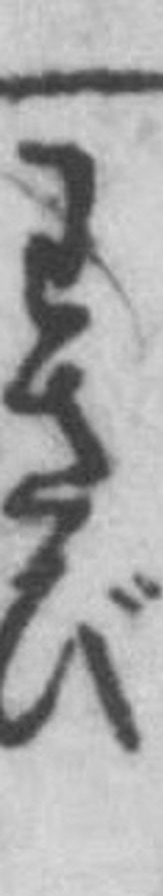わさび
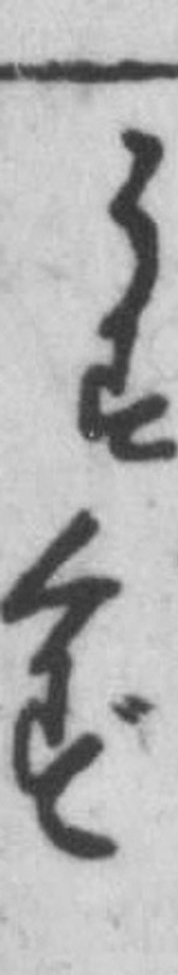うをくず
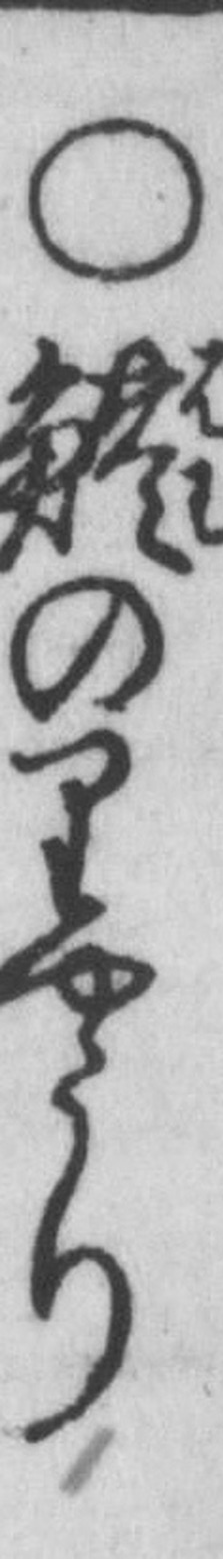○鱧のりやうり
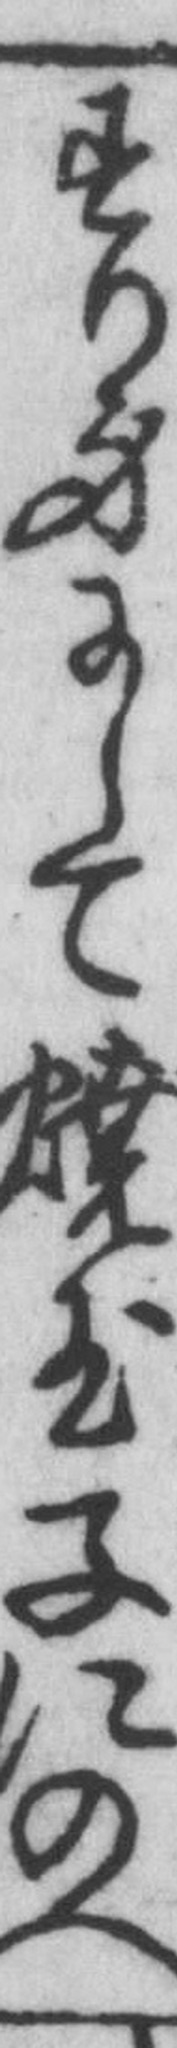すり身にして焼玉子にのべ
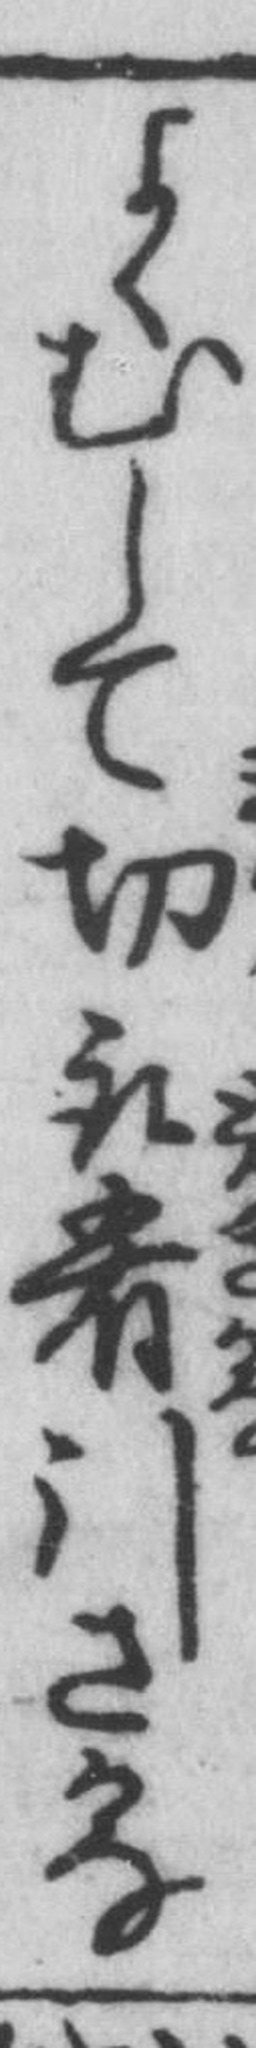よくむして切取肴引さかな
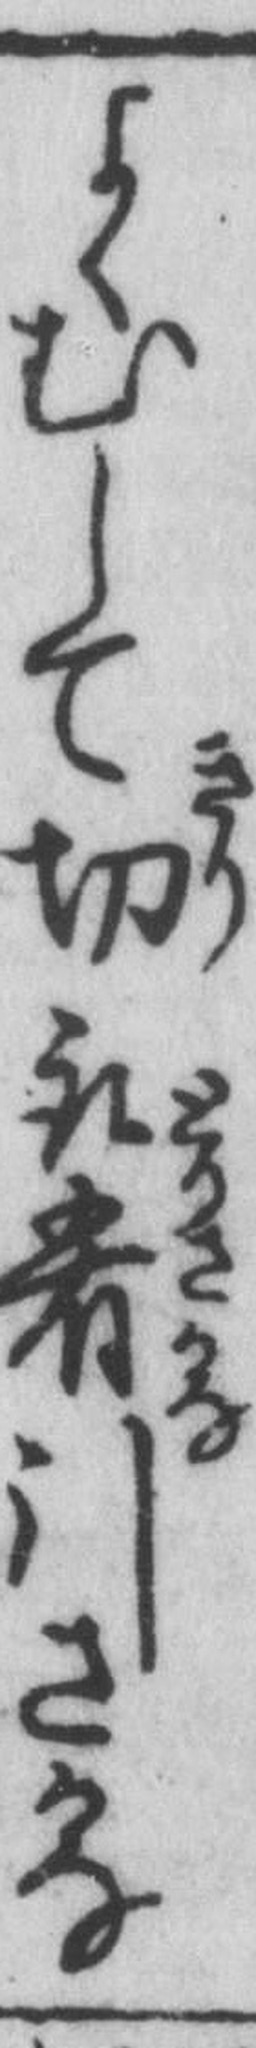よくむして切取肴引さかな
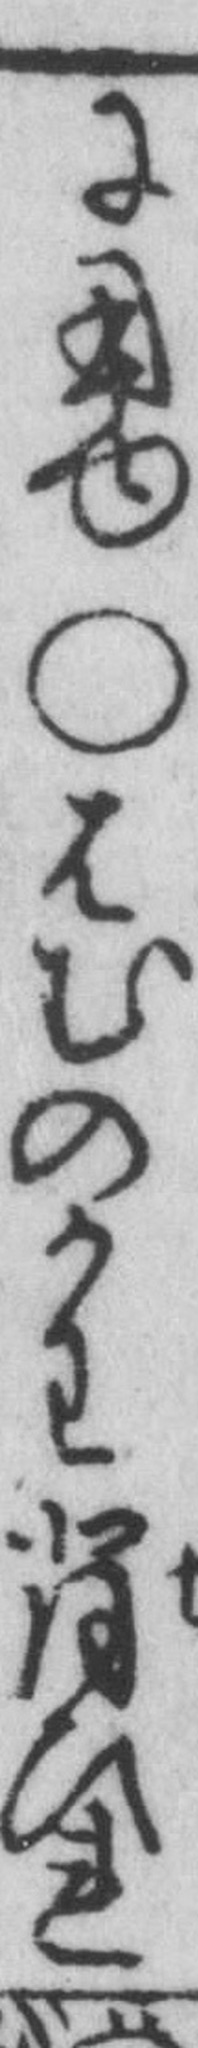に用ゆ○はむのかわ背ひれ
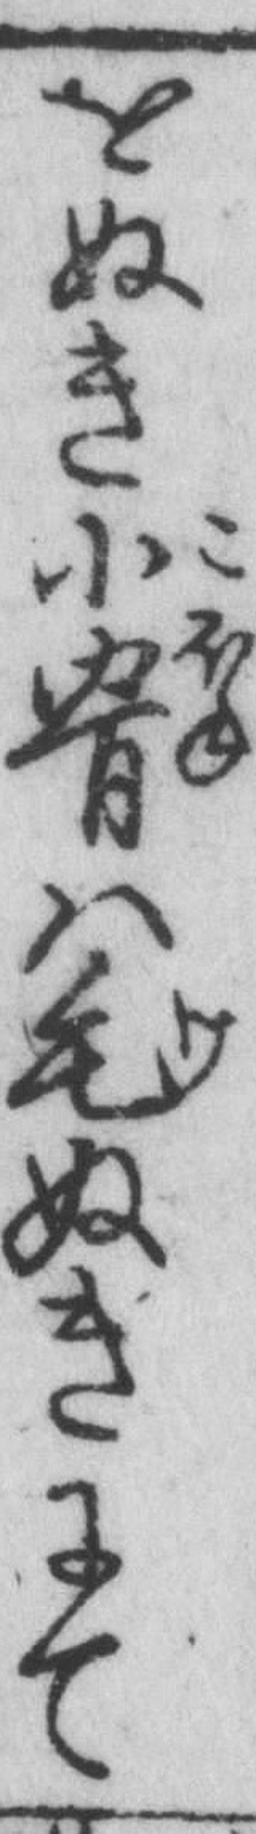をぬき小骨は毛ぬきにて
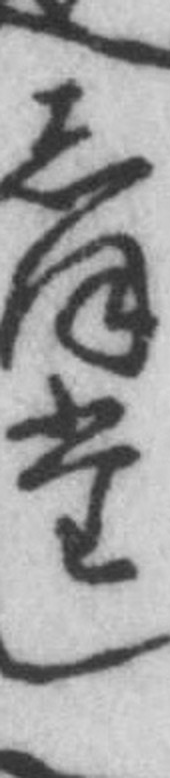しほだし
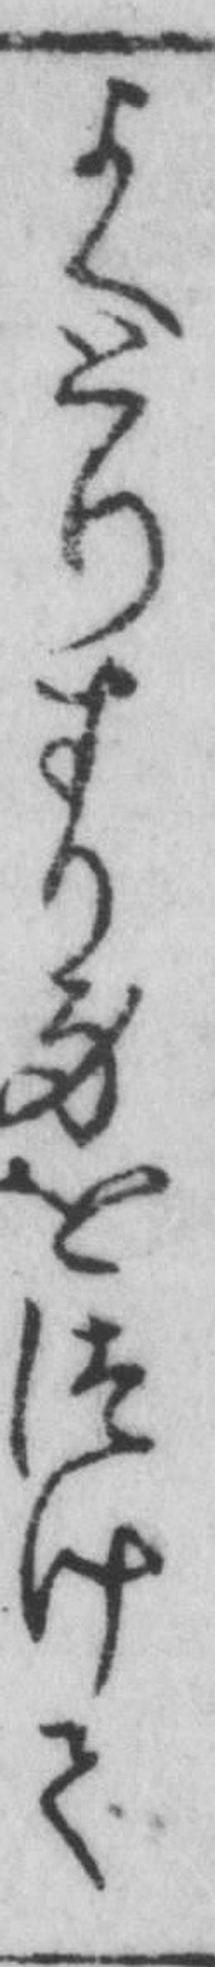よくとりすり身をつけて
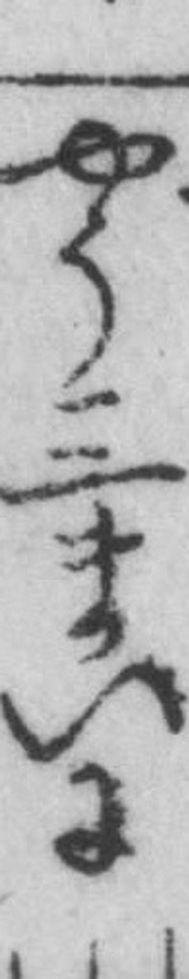やう三まいに
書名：料理献立抄
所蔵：大阪府立大学学術情報センター 国文学研究資料館
